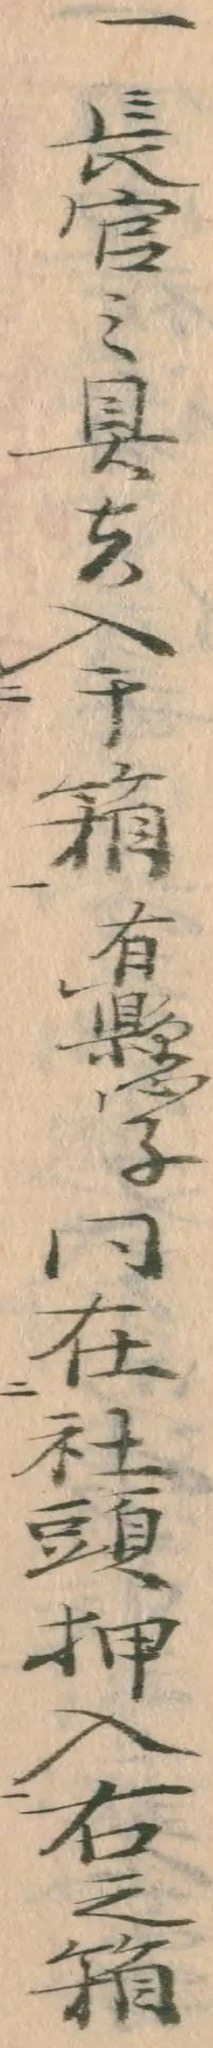一長官之具者入于箱有懸子同在社頭押入右之箱
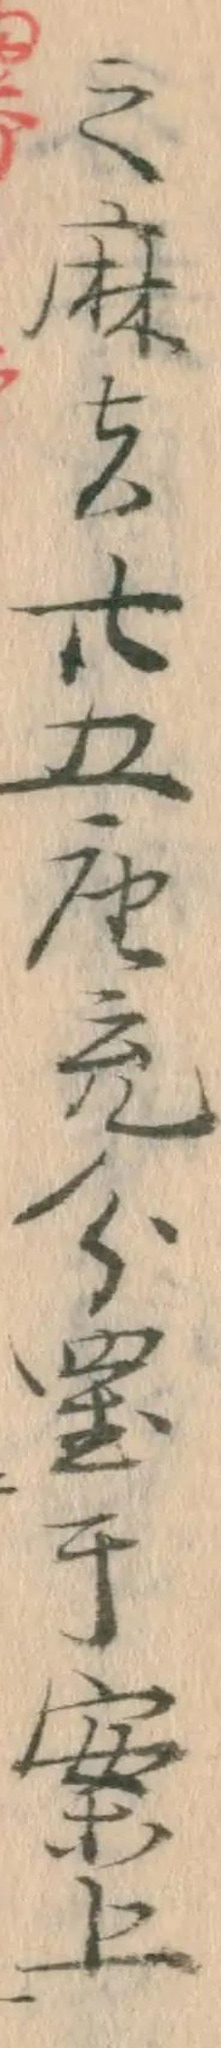之麻者廿五座充分置于案上
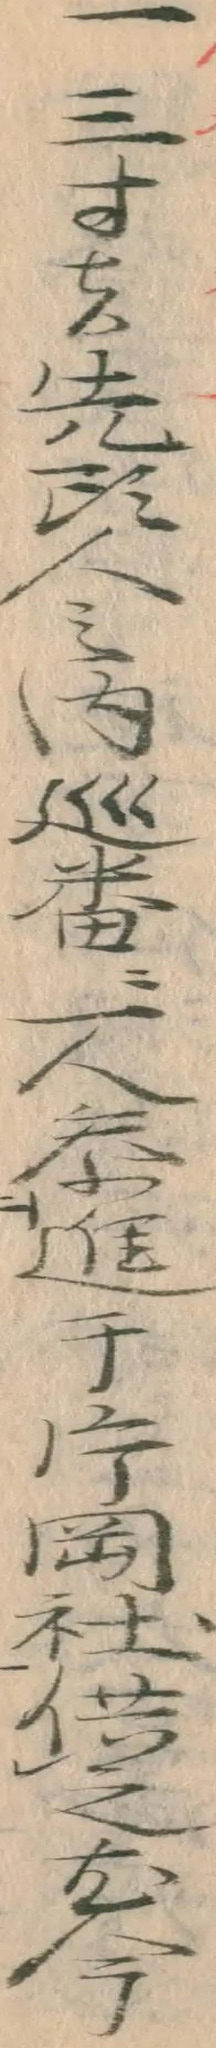一三寸者先頭人之内巡番ニ一人参進于片岡社供之尤今
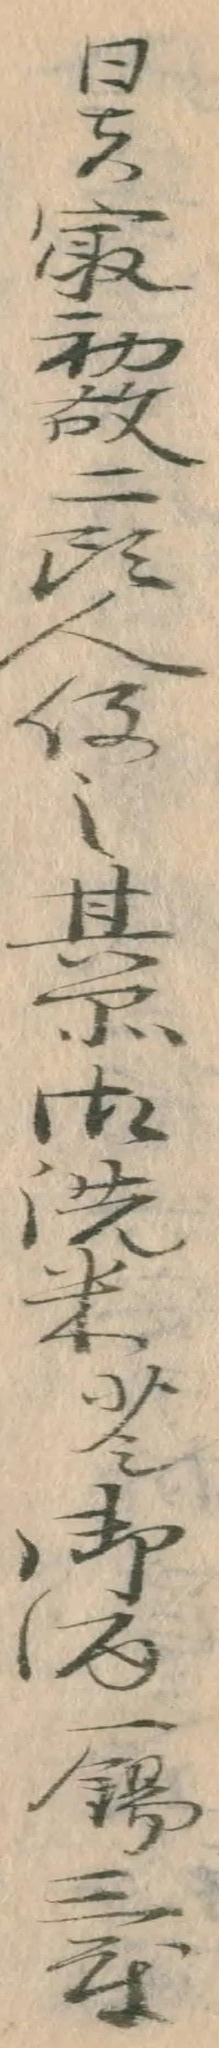日者最初故二頭人役也其品御洗米少シ御酒一錫三度
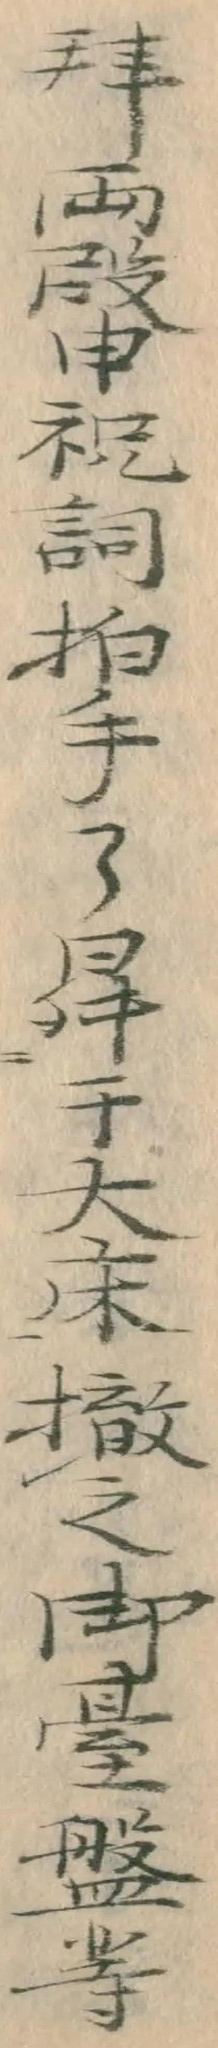拝両段申祝詞拍手了昇于大床撒之御台盤等

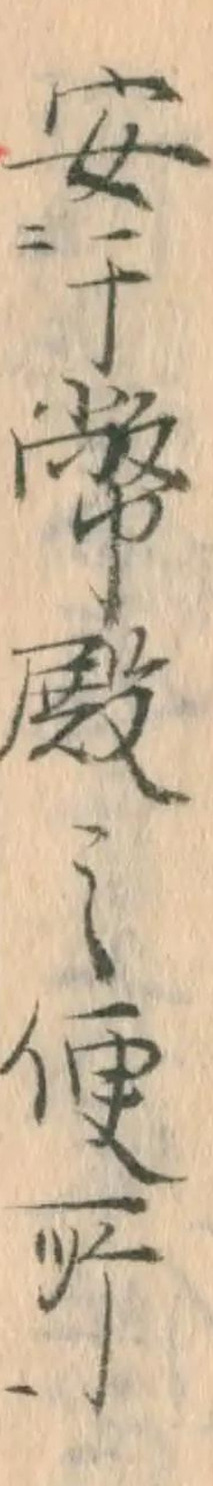安于幣殿之便所
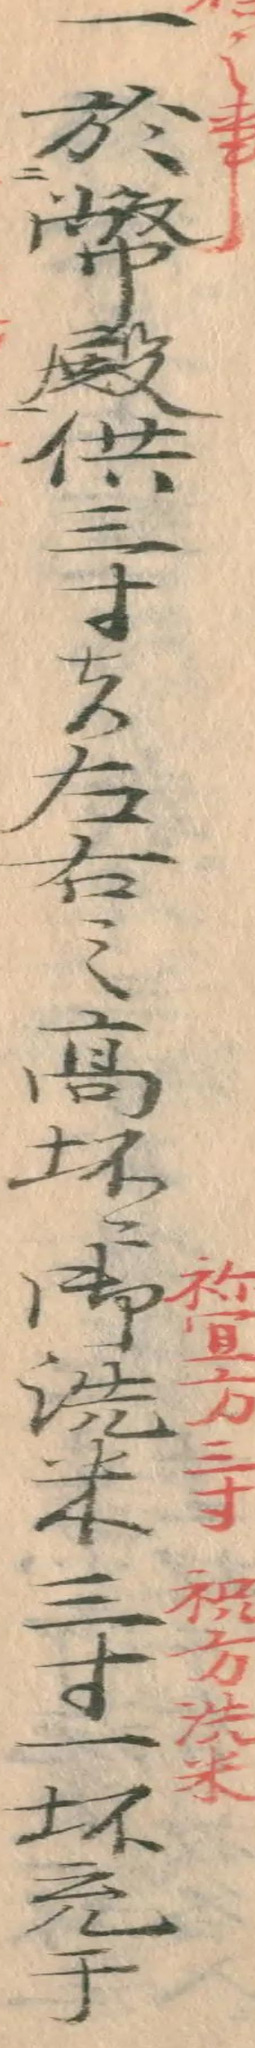一於幣殿供三寸者左右之高杯ニ御洗米三寸一杯充于
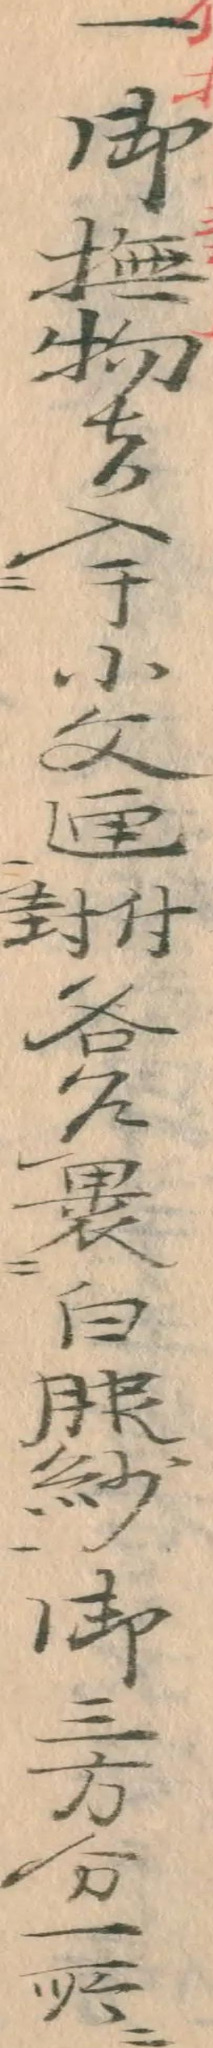一御撫物者入于小文匣付封各乍包白服紗御三方一所ニ
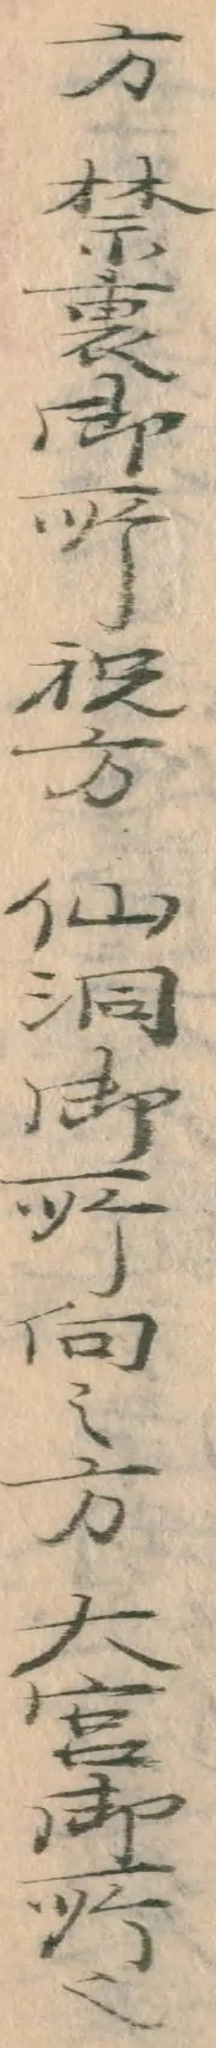方禁裏御所祝方仙洞御所向之方大宮御所也
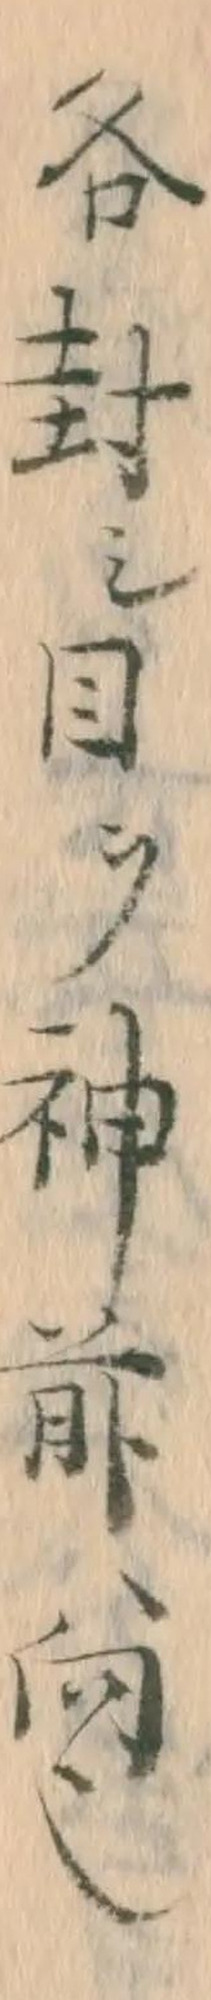各封シ目ヲ神前ヘ向也
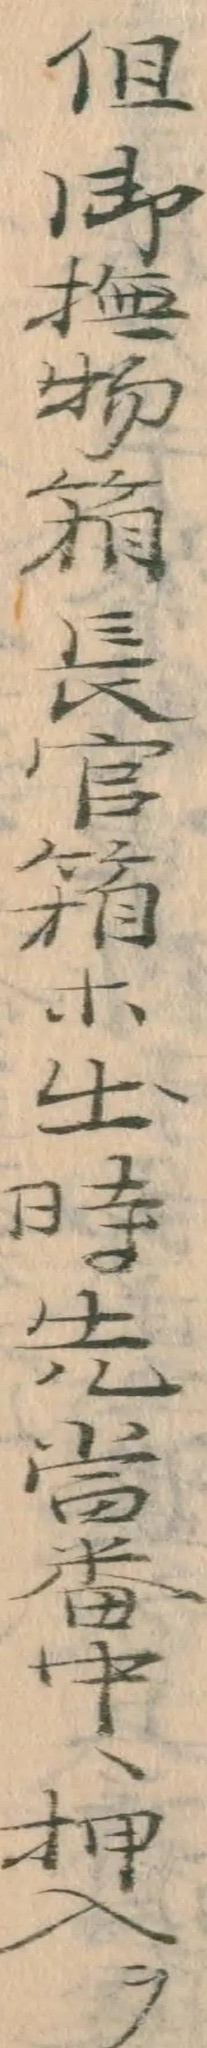但御撫物箱長官箱等出時先當番中へ押入ヲ
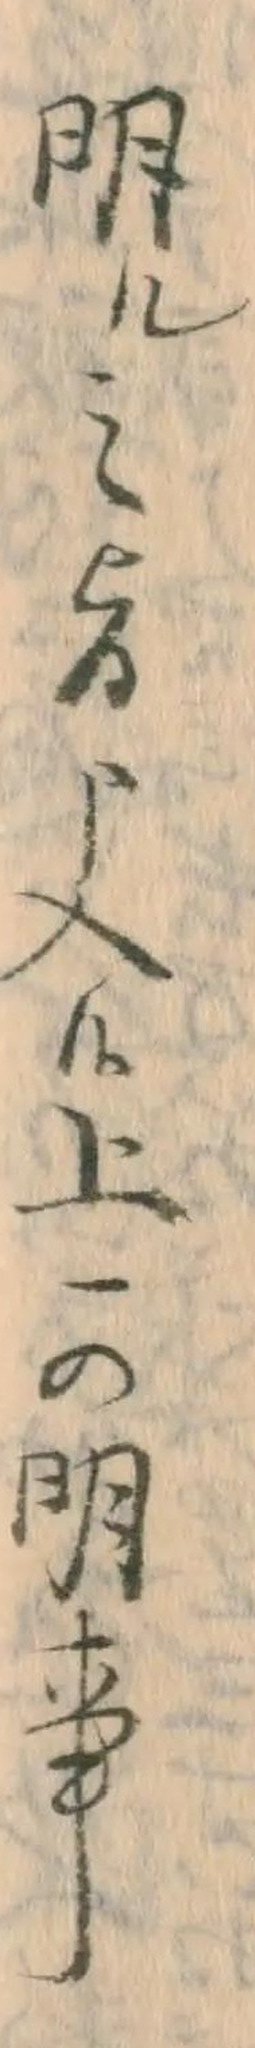明ル之旨申入候上可明事
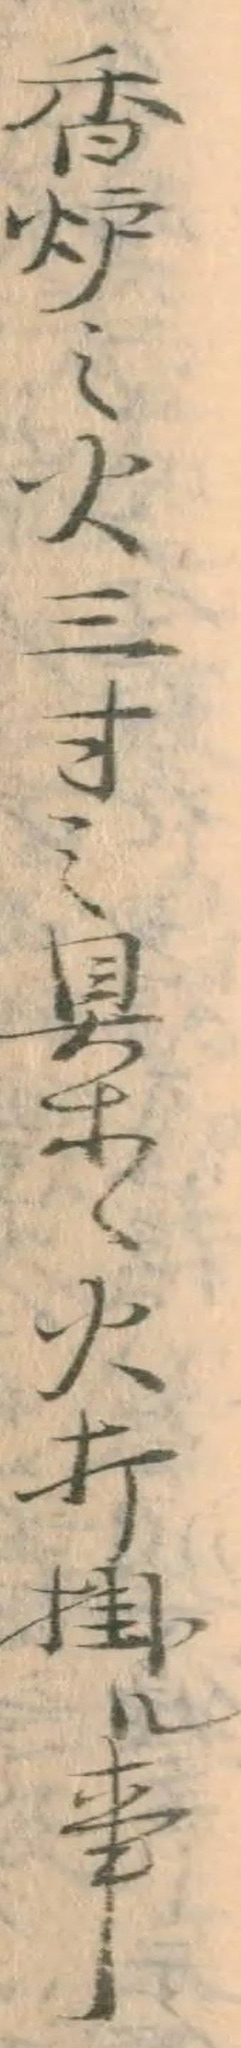香炉之火三寸之具等へ火打掛ル事
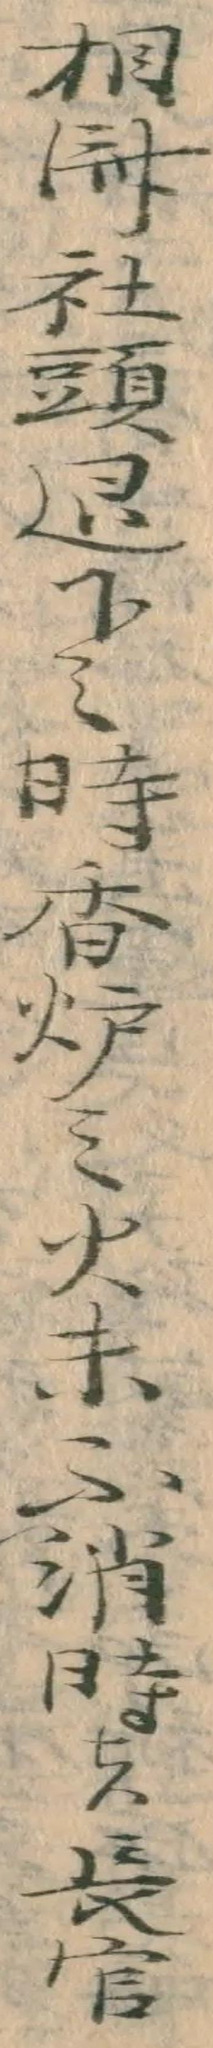相済社頭退下之時香炉之火未不消時は長官
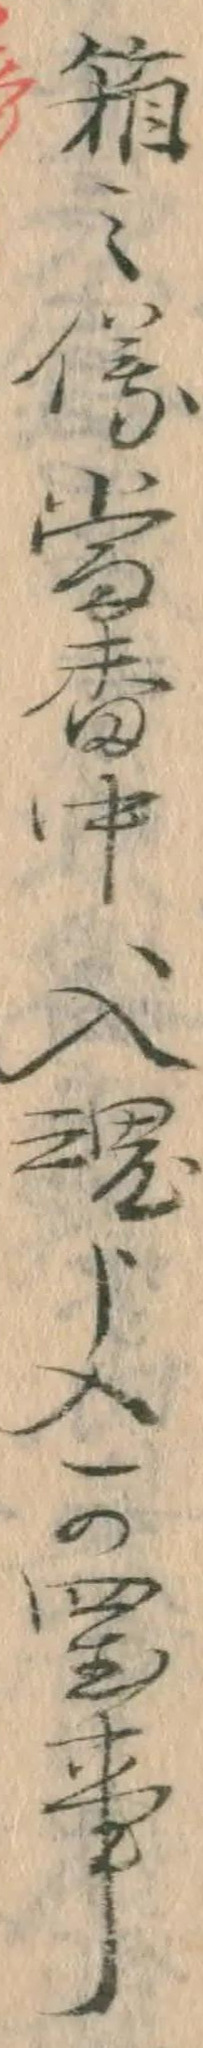箱之儀當番中へ入魂申入可置事
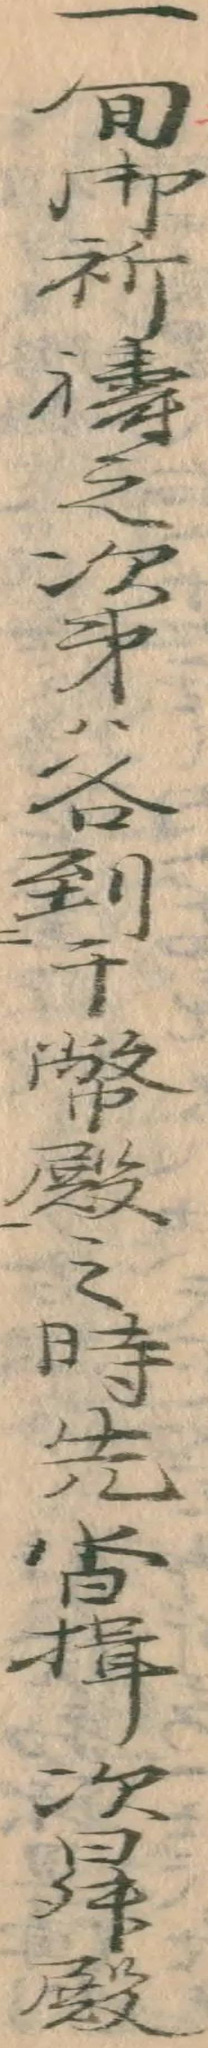一旬御祈祷之次第ハ各到于幣殿之時先沓揖次昇殿
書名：賀茂社記録. 第72冊
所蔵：国立国会図書館 National Diet Library, JAPAN
